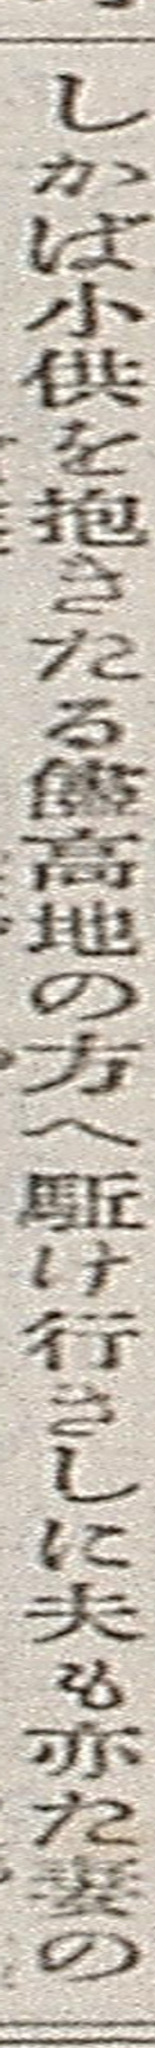しかば小供を抱きたる侭高地の方へ駈け行きしに夫も亦た妻の
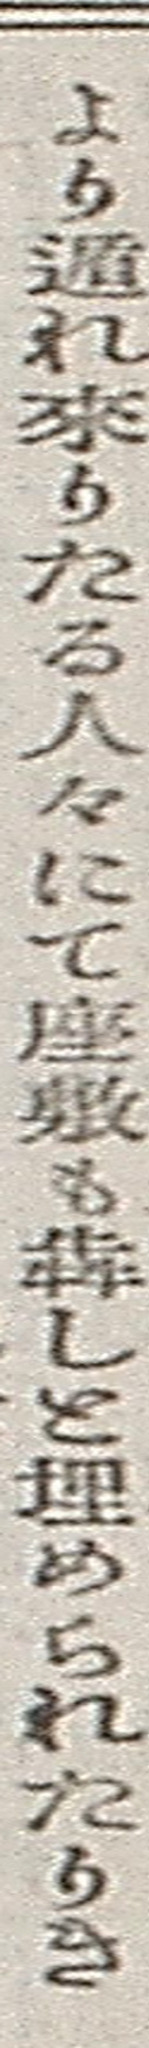より遁れ来りたる人々にて座敷も犇しと埋められたりき
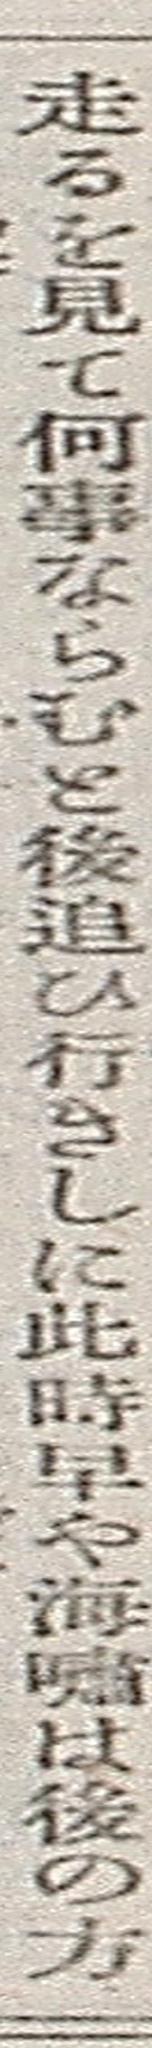走るを見て何事ならむと後追ひ行きしに此時早や海嘯は後の方
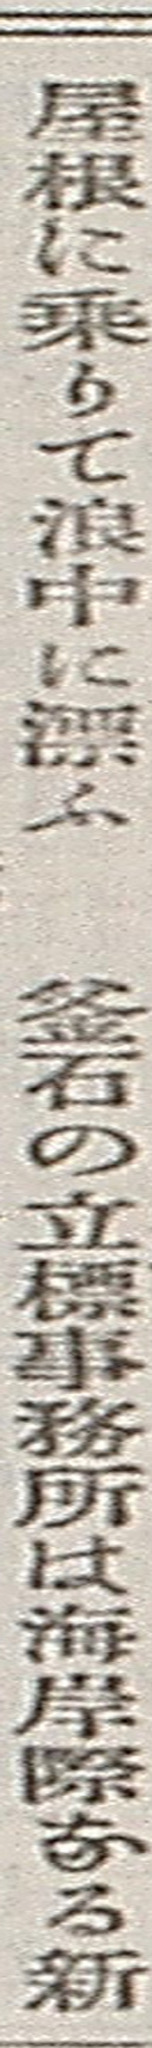屋根に乗りて浪中に漂ふ釜石の立標事務所は海岸際なる新
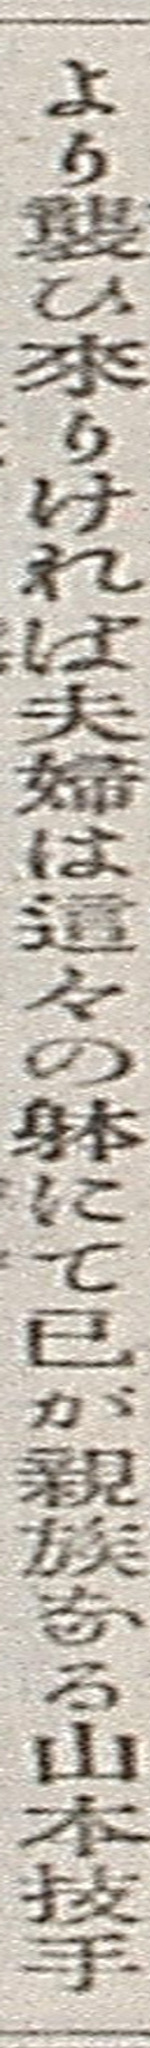より襲ひ来りければ夫婦は這々の体にて己が親族なる山本技手
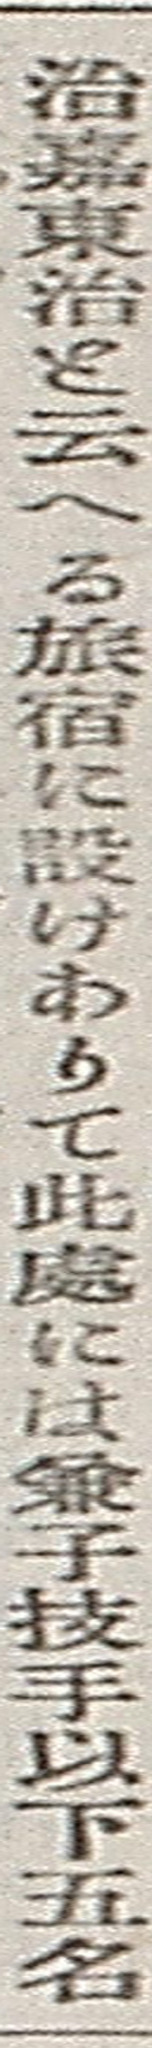治嘉東治と云へる旅宿に設けありて此処には兼子技手以下五名
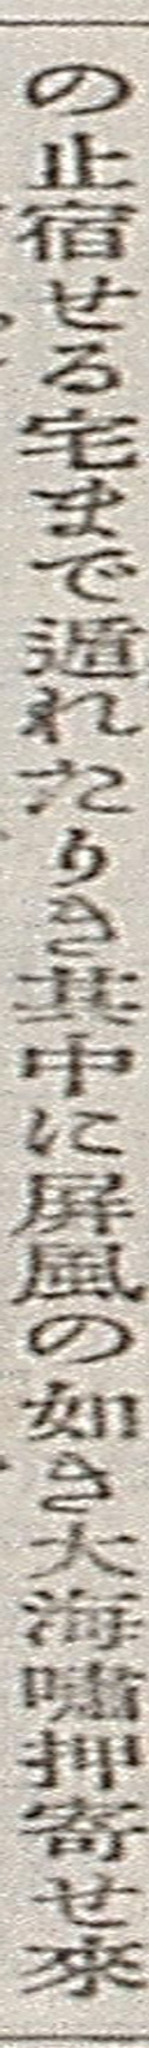の止宿せる宅まで遁れたりき其中に屏風の如き大海嘯押寄せ来
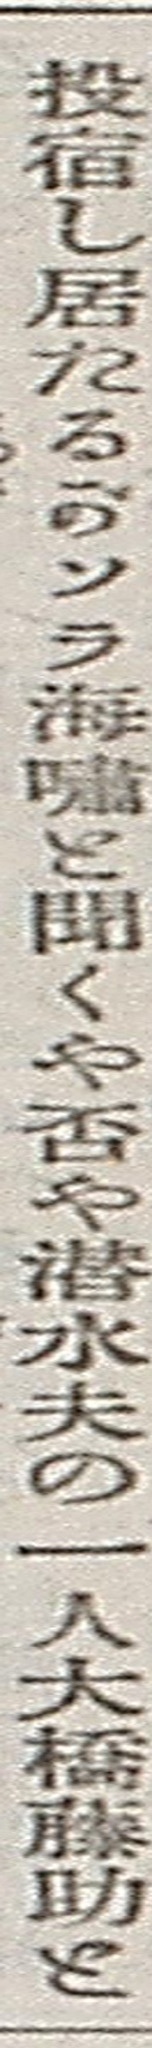投宿し居たるがソラ海嘯と聞くや否や潜水夫の一人大橋藤助と
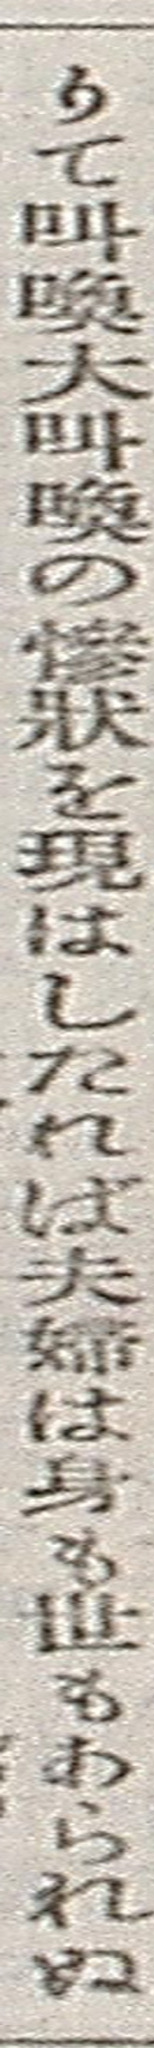りて叫喚大叫喚の惨状を現はしたれば夫婦は身も世もあられぬ
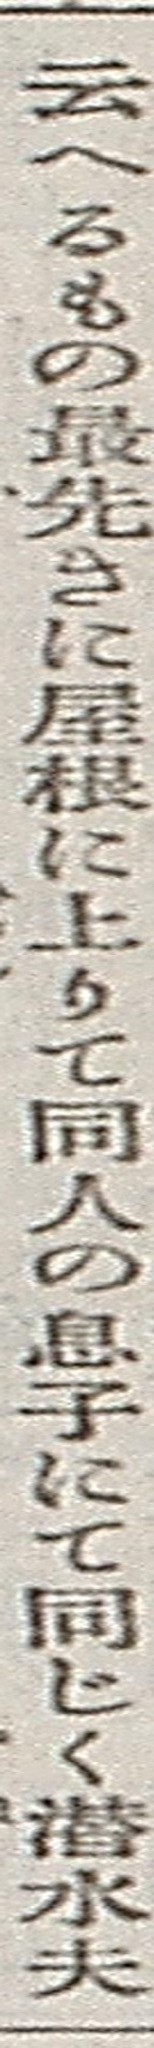云へるもの最先きに屋根に上りて同人の息子にて同じく潜水夫
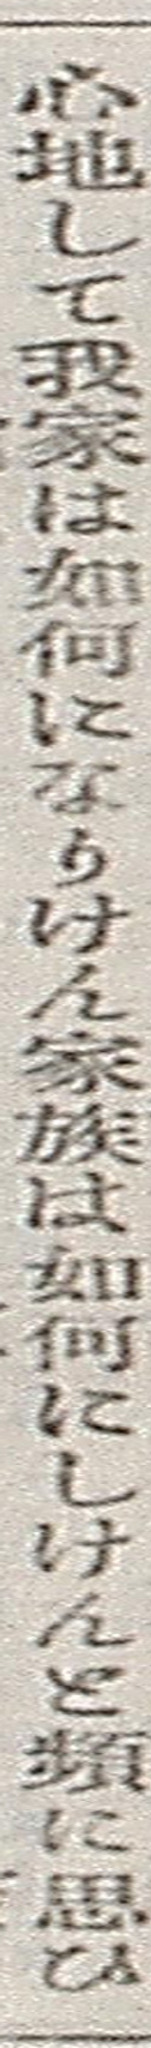心地して我家は如何になりけん家族は如何にしけんと頻に思ひ
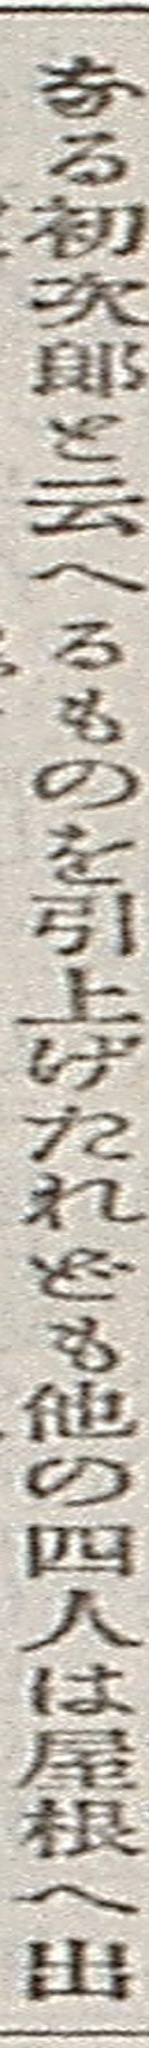なる初次郎と云へるものを引上げたれども他の四人は屋根へ出
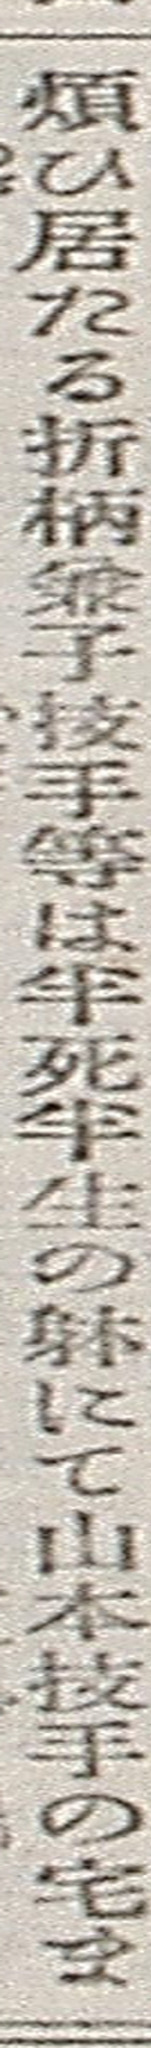煩ひ居たる折柄兼子技手等は半死半生の体にて山本技手の宅ま
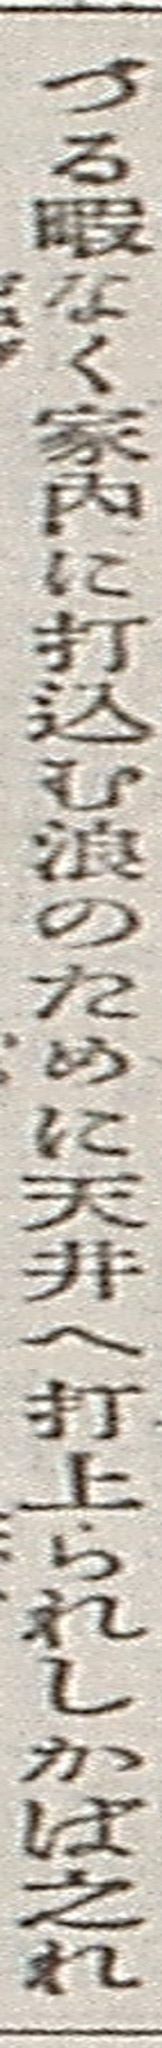づる暇なく家内に打込む浪のために天井へ打上られしかば之れ
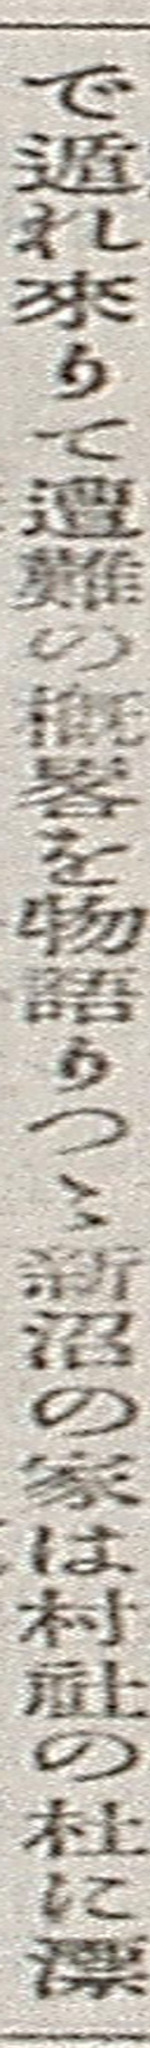で遁れ来りて遭難の概略を物語りつ〻新沼の家は村社の杜に漂
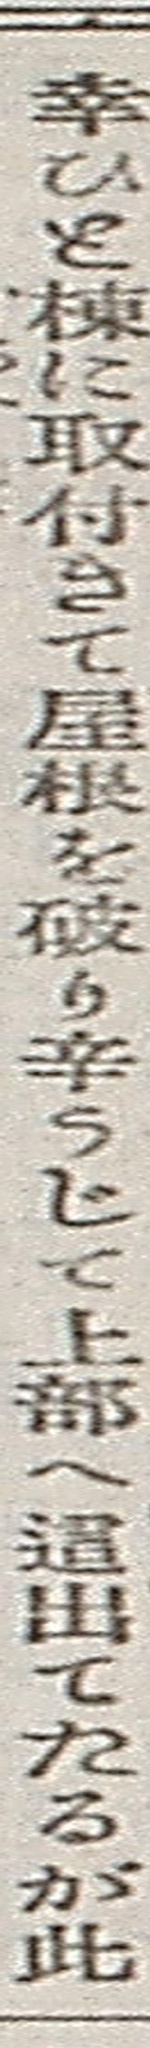幸ひと棟に取付きて屋根を破り辛うじて上部へ這出てたるが此
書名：風俗畫報臨時増刊第百二十號　大海嘯被害録（下）
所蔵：東京大学地震研究所図書室 Earthquake Research Institute Library, The University of Tokyo, JAPAN
